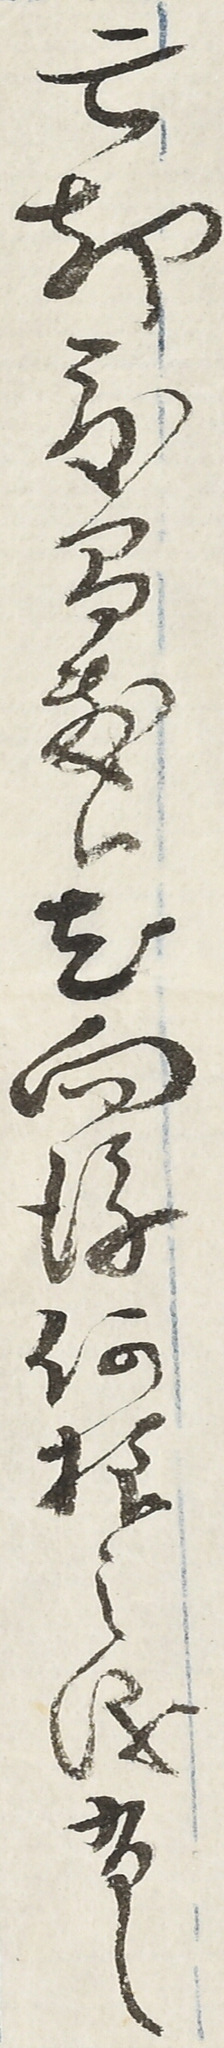亡却致間敷候尤向後何様之儀有之
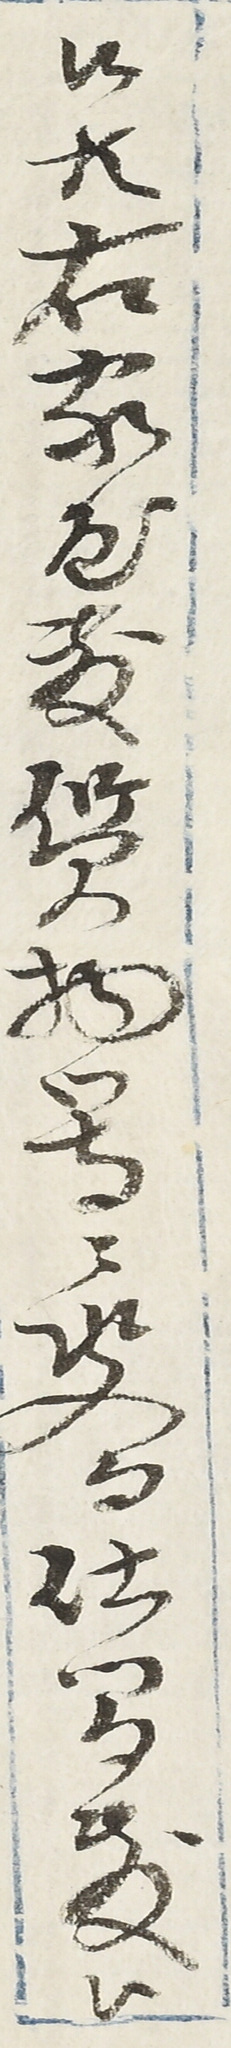候共右家屋敷質物等ニ決而仕間敷候
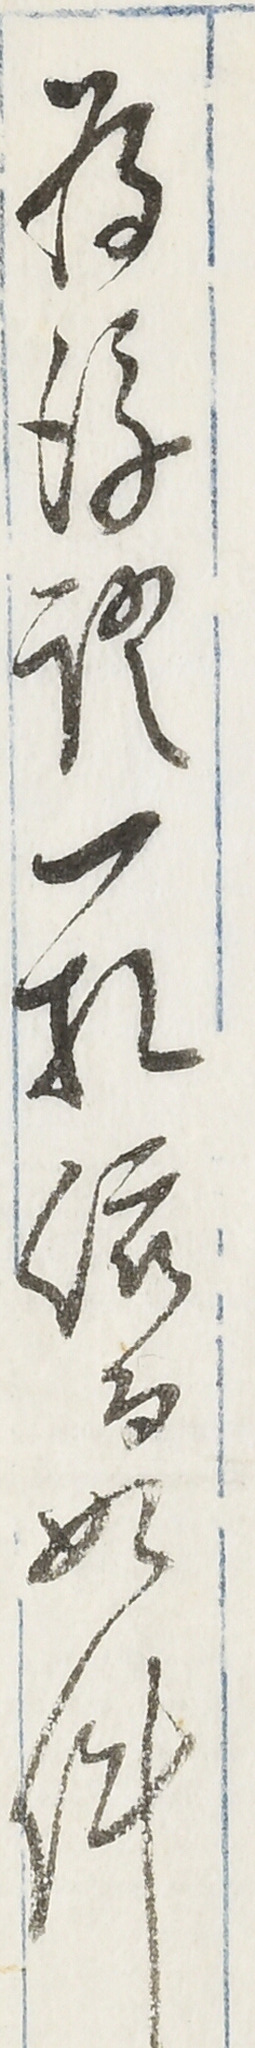為後証一札依而如件
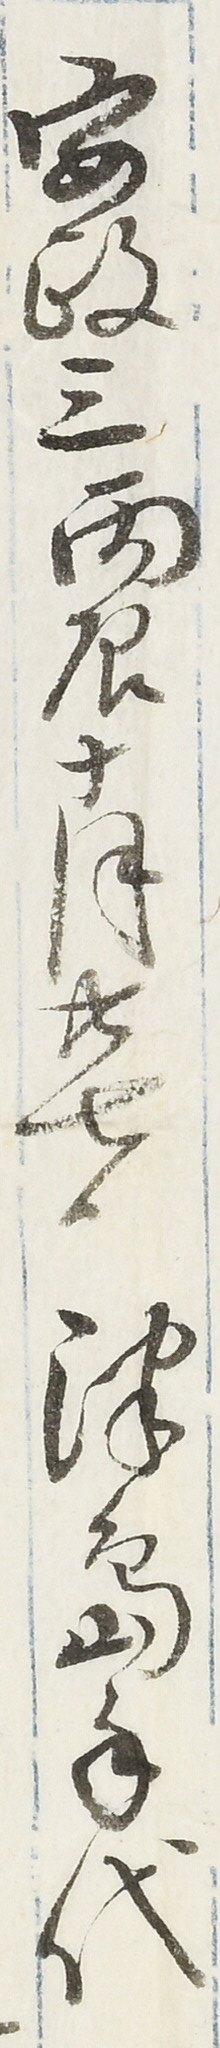安政三丙辰十月廿七日津島手代
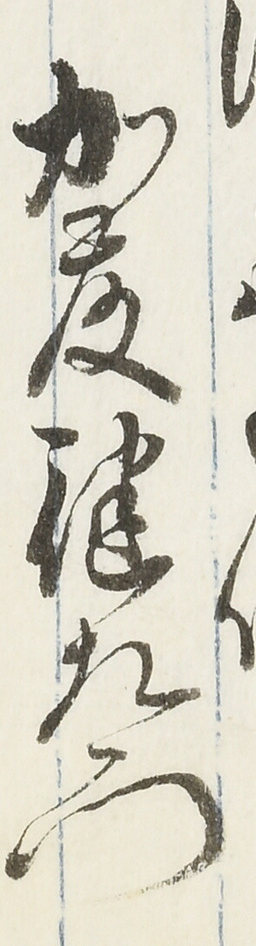加藤健左衛門
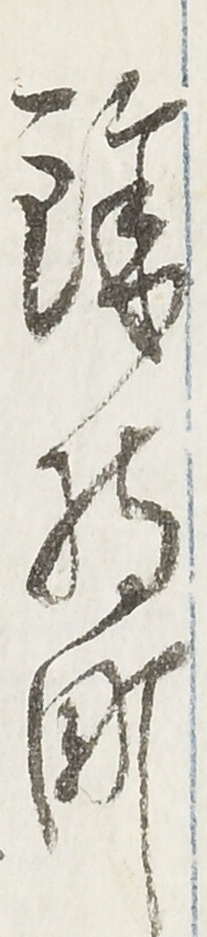鉾持町
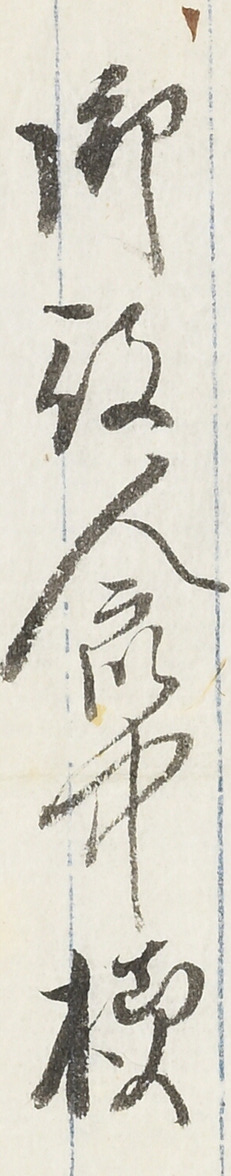御役人衆中様

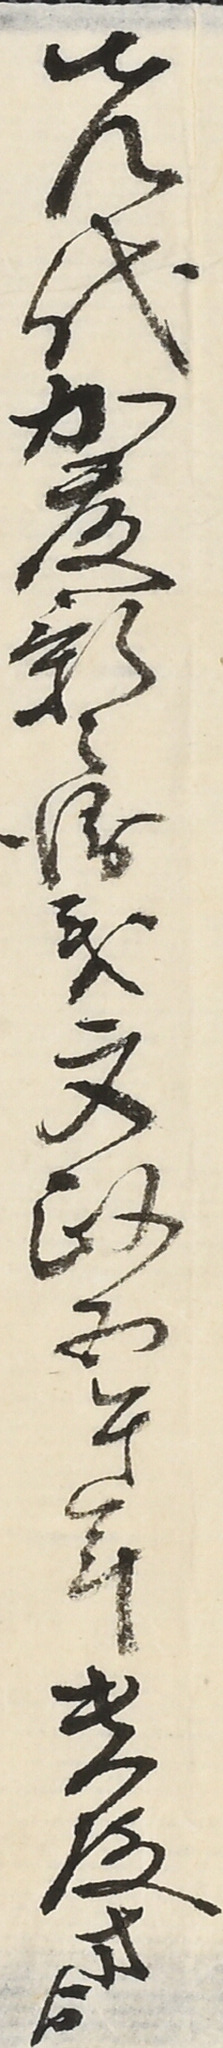先代加藤新兵衛義文政五午年貴殿方ゟ
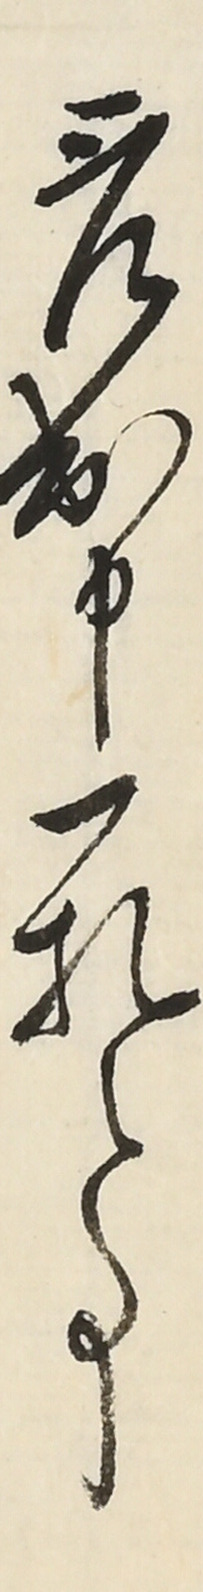差出申一札之事
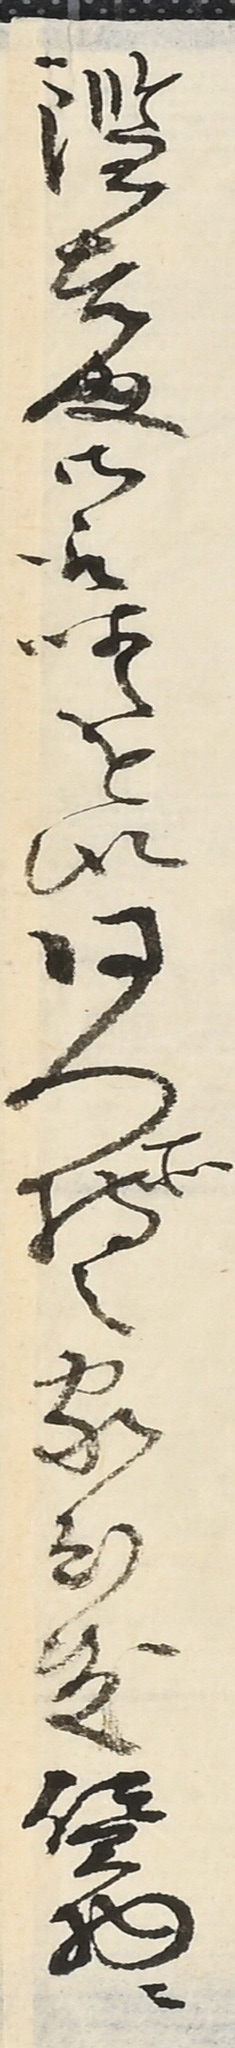鑑吉殿御取咄しを以同人所持之家屋敷質物ニ
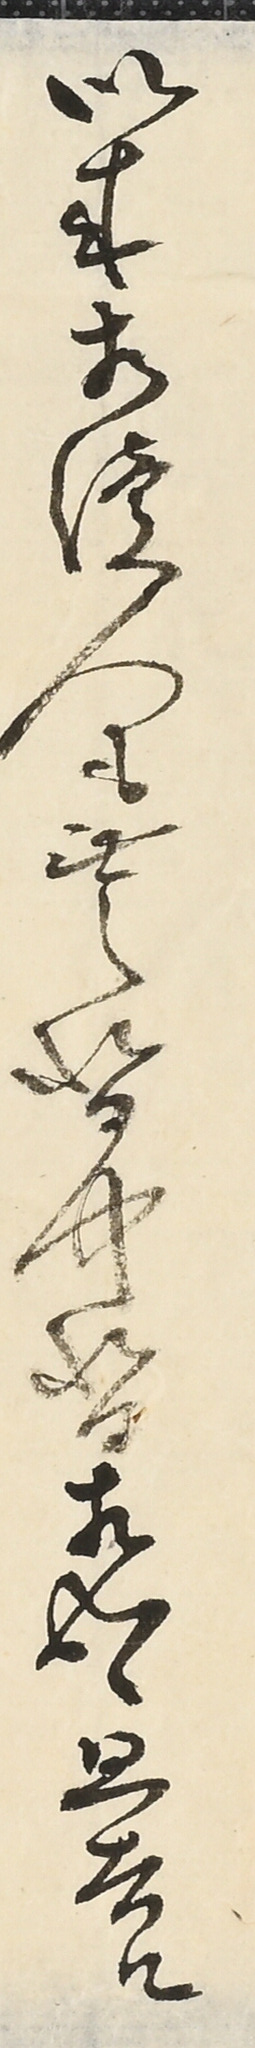以来相続人も無之暫中暫相成候且去ル
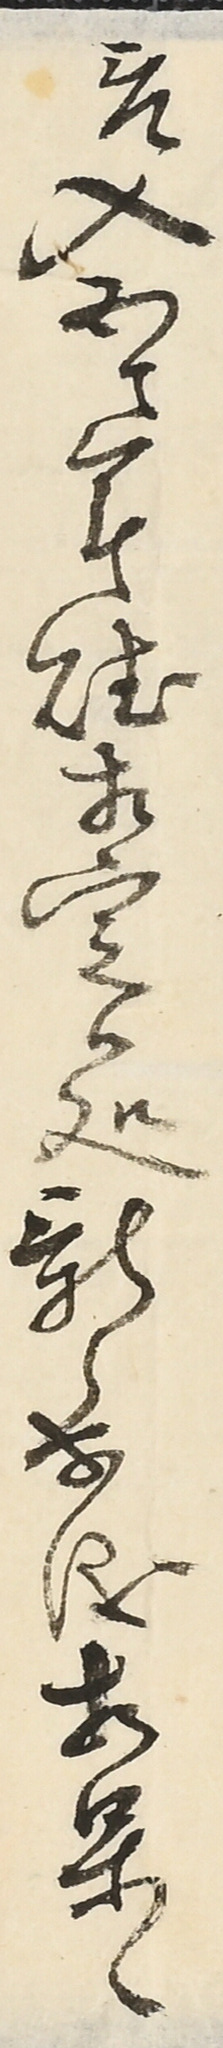差入五ケ年賦相定候処新兵衛儀相果候
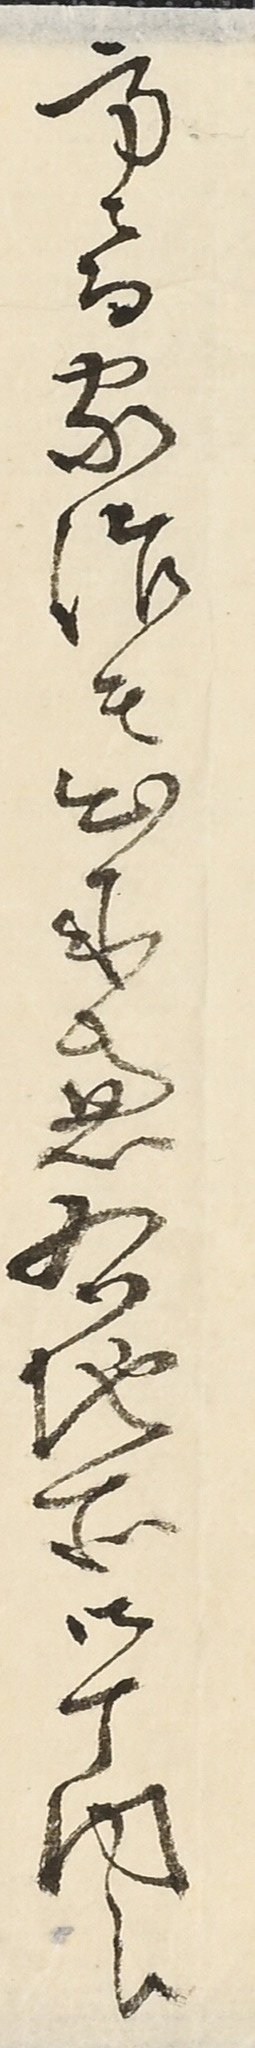方ニ而家作モ出来兼右地所御丁内江
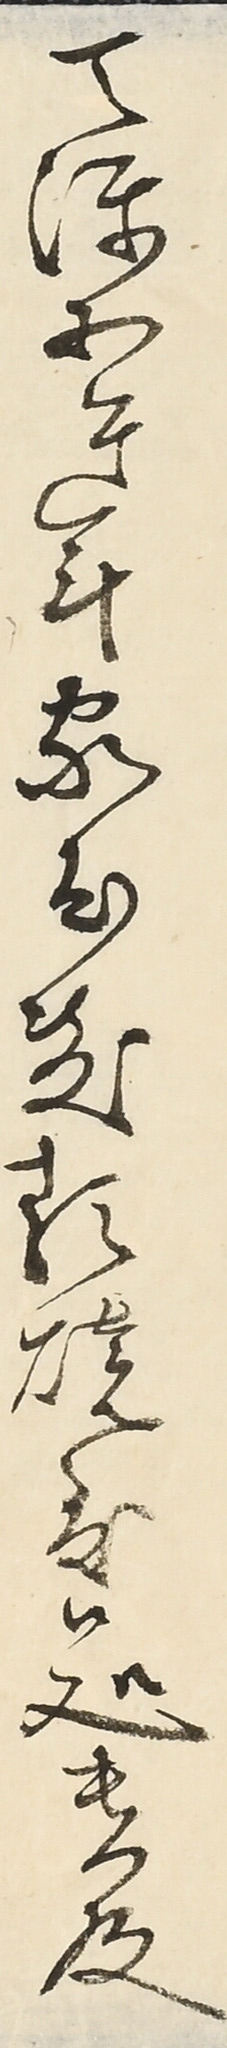天保五午年家屋敷類焼致候処貴殿
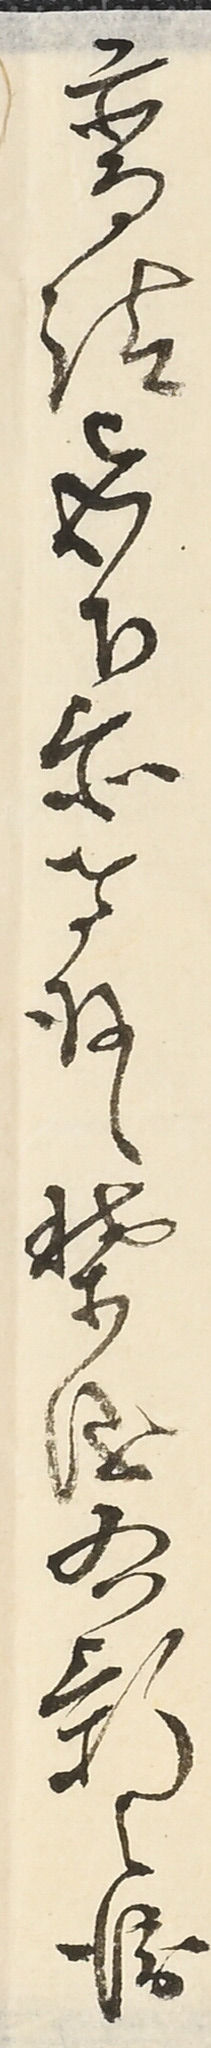普請被成下忝奉存候我等儀右新兵衛
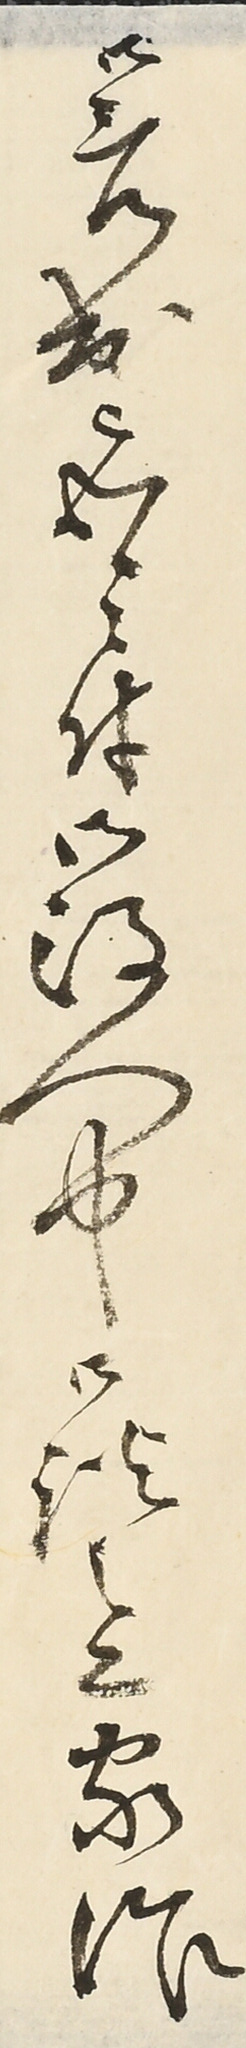御差出被成候ニ付御役人中御談之上家作
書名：差出申一札之事
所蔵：伊那市立高遠町図書館・合同会社AMANE
